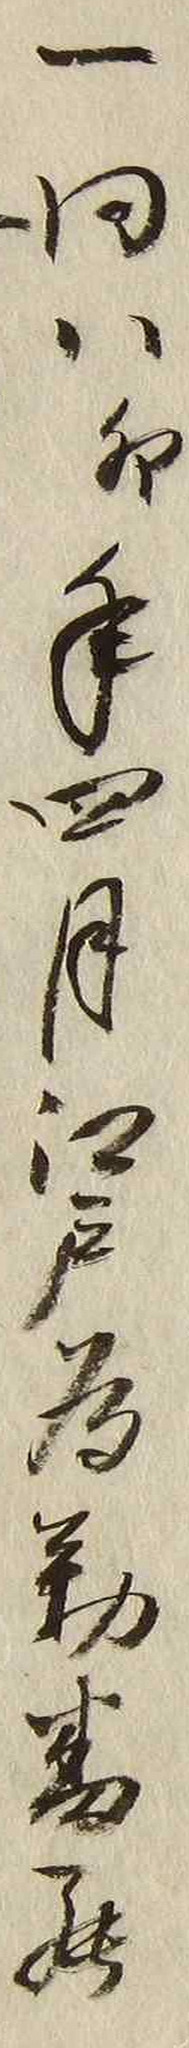一同八卯年四月江戸為勤番罷
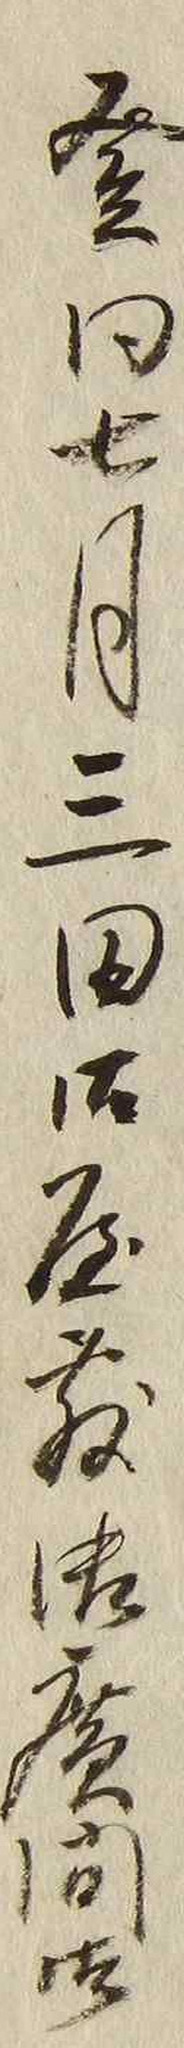登同七月三田御屋敷御広間御

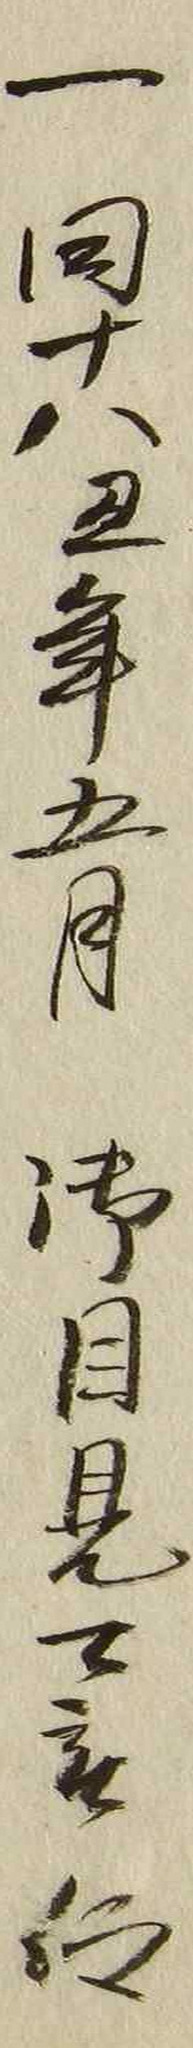一同十八丑年五月御目見可被仰
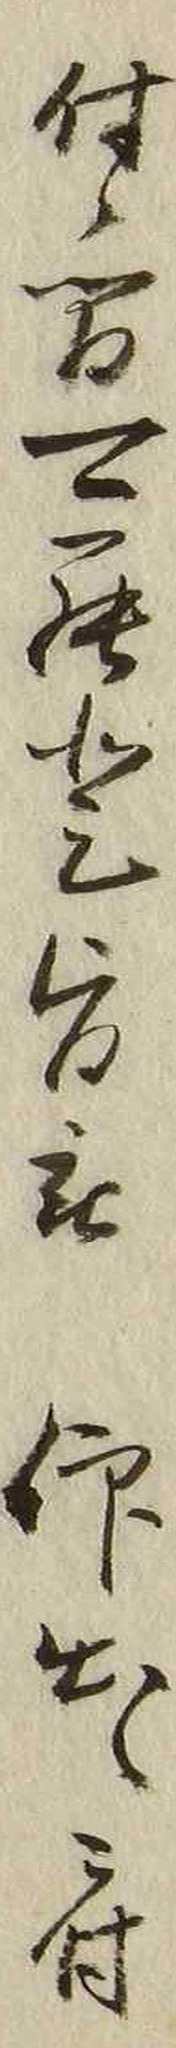付候間可罷登旨被仰出候ニ付
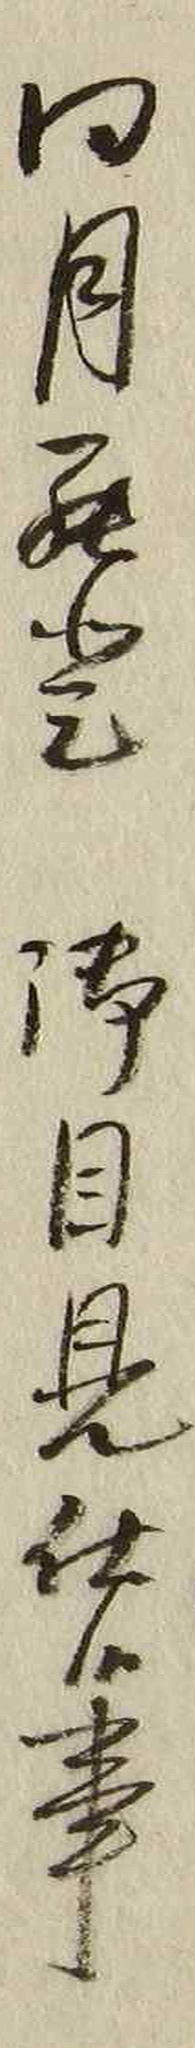同月罷登御目見仕候事
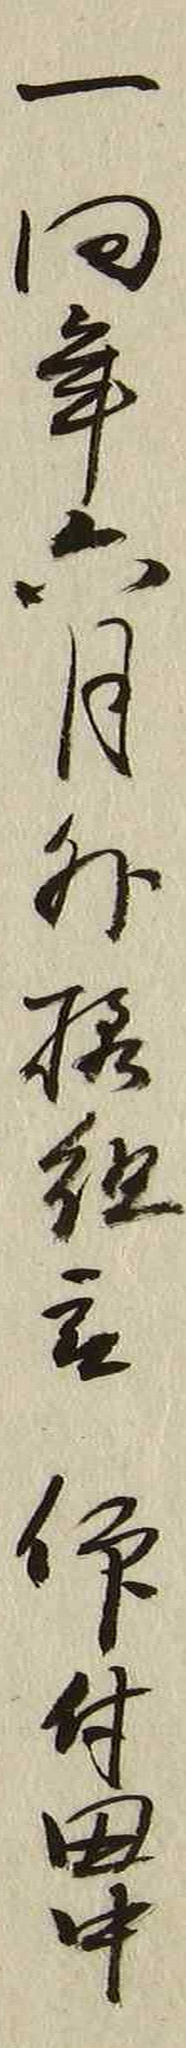一同年六月外様組被仰付田中
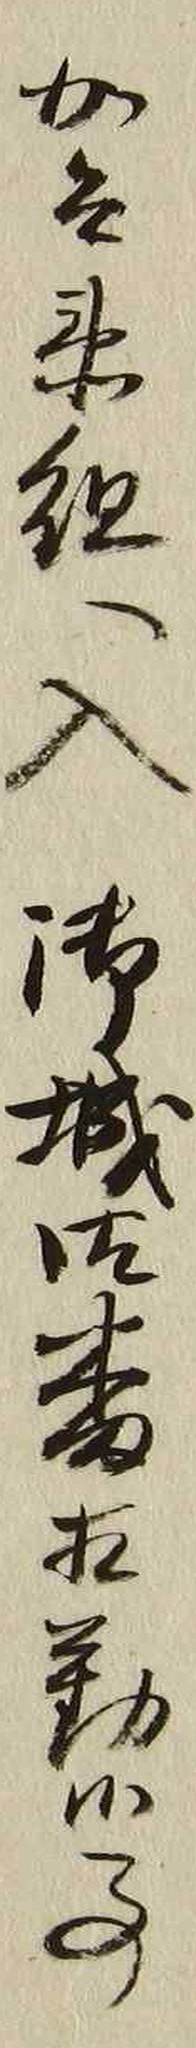加兵衛組へ入御城御番相勤候事
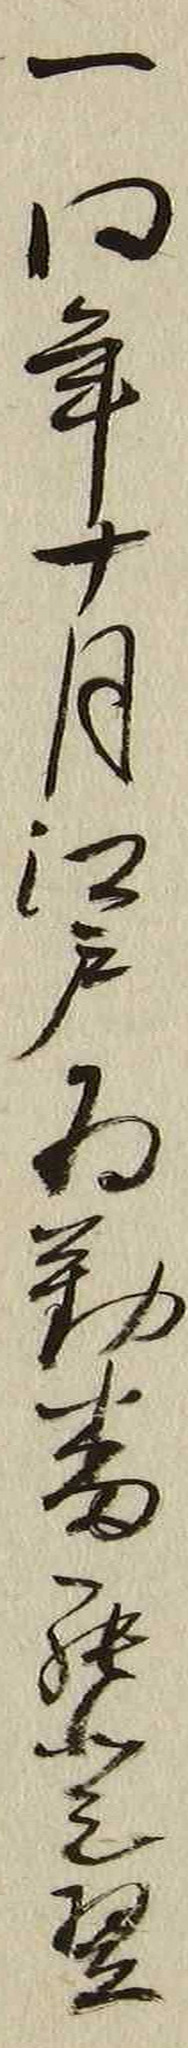一同年十月江戸為勤番罷登翌
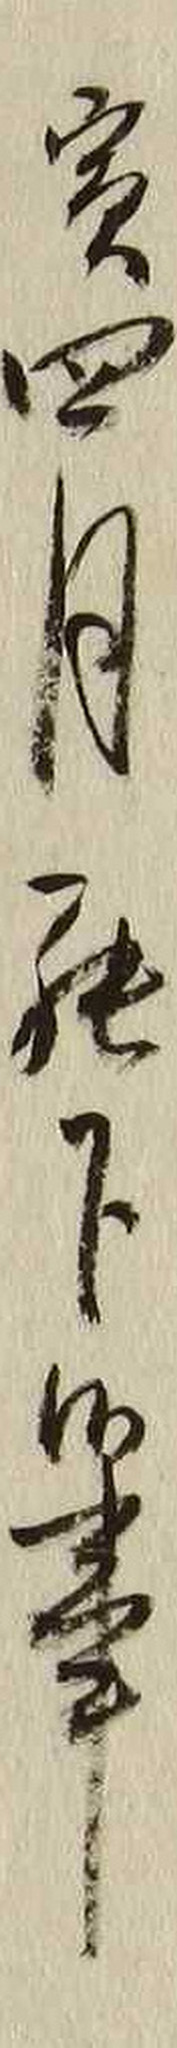寅四月罷下候事
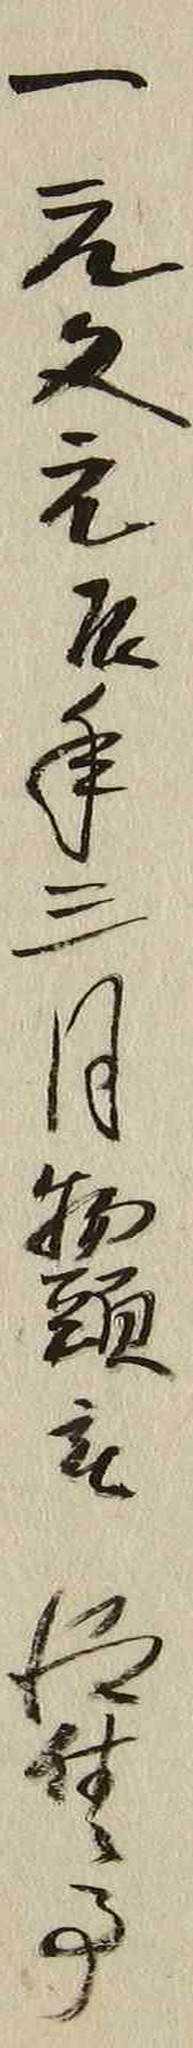一元文元辰年三月物頭被仰付候事
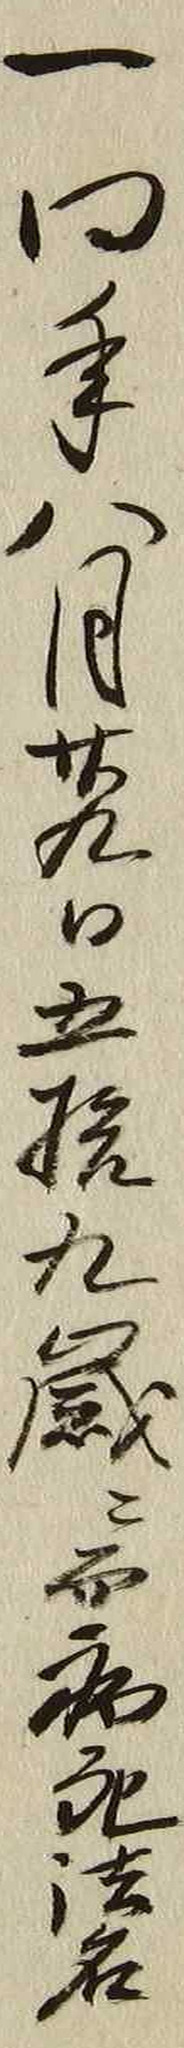一同年八月廿九日五拾九歳ニ而病死法名
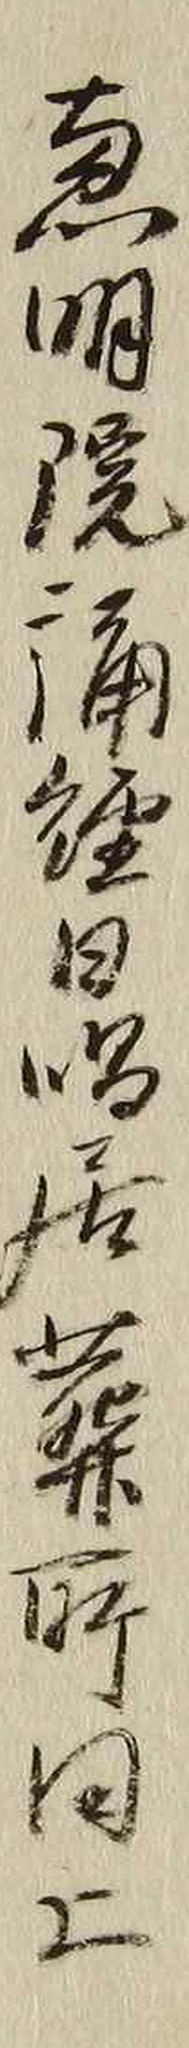恵明院誦経日唱居葬所同上
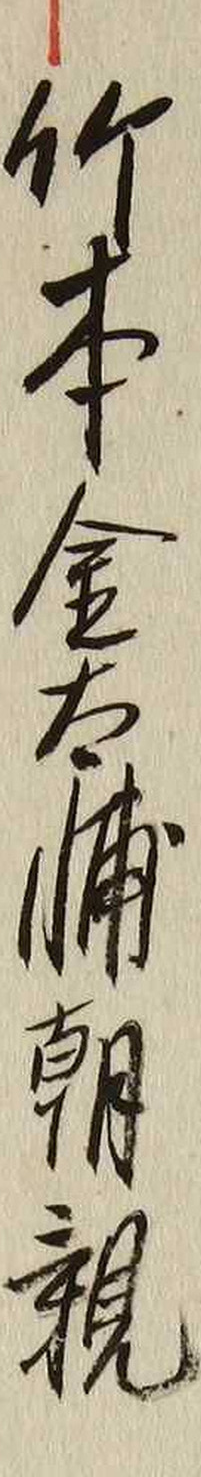竹本金太輔朝親
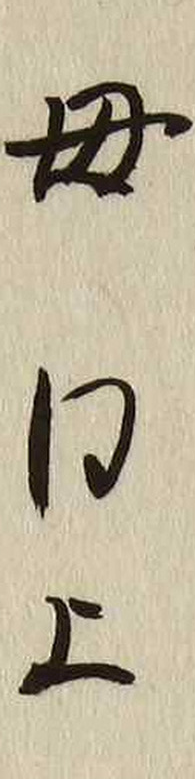母同上
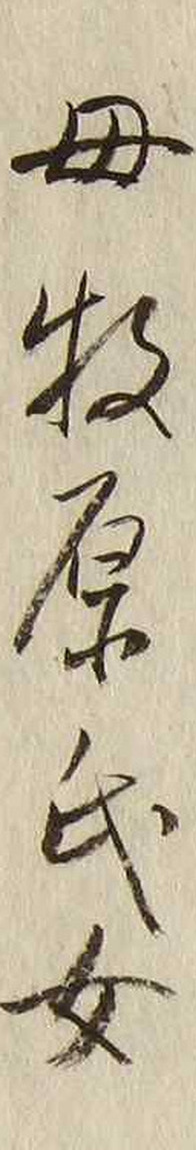母牧原氏女

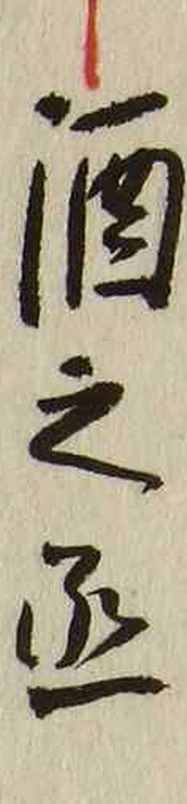酒之丞
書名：諸士系譜　巻之356　す之部6
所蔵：会津若松市立会津図書館
